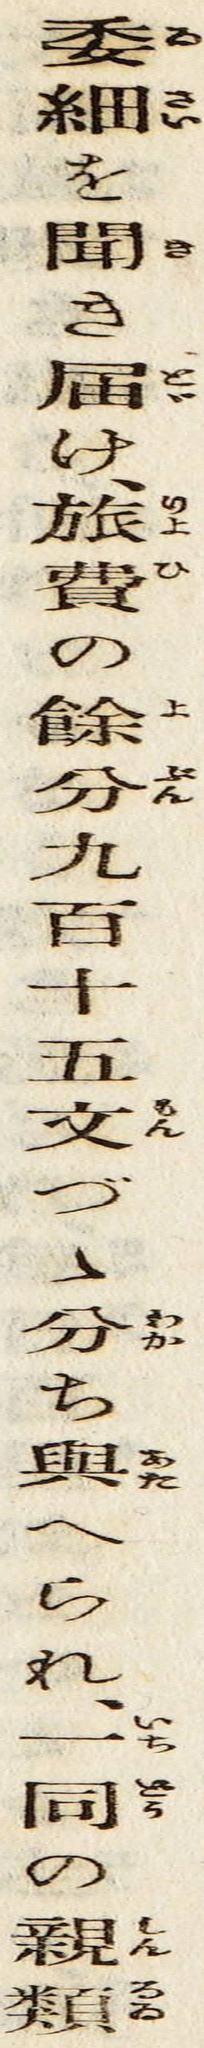委細を聞き届け、旅費の余分九百十五文づゝ分ち与へられ、一同の親類
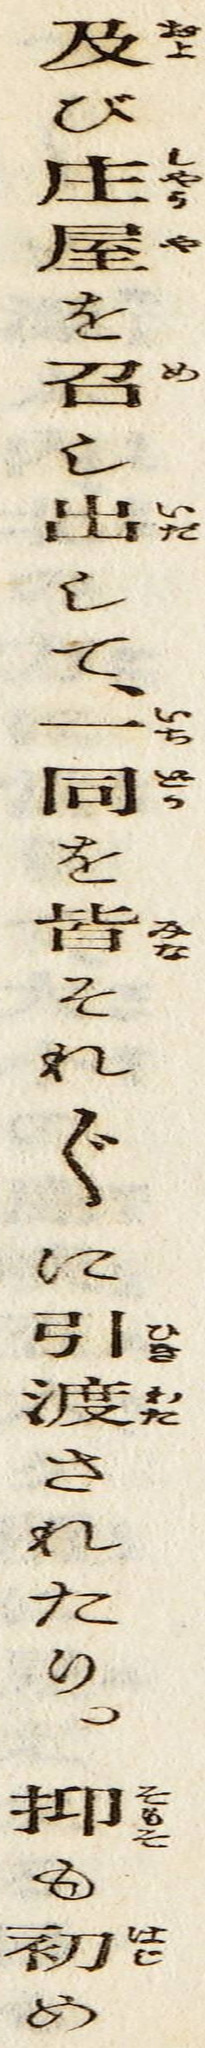及び庄屋を召し出して、一同を皆それ〴〵に引渡されたり。抑も初め
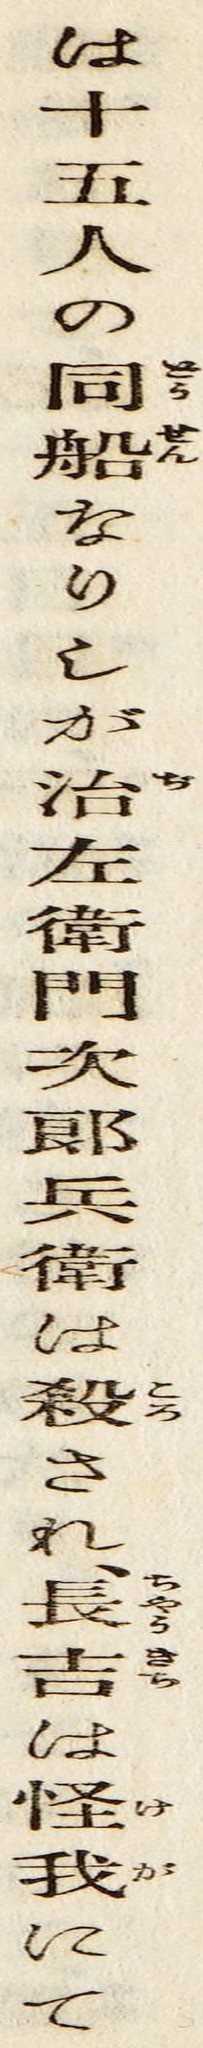は十五人の同船なりしが治左衛門次郎兵衛は殺され、長吉は怪我にて
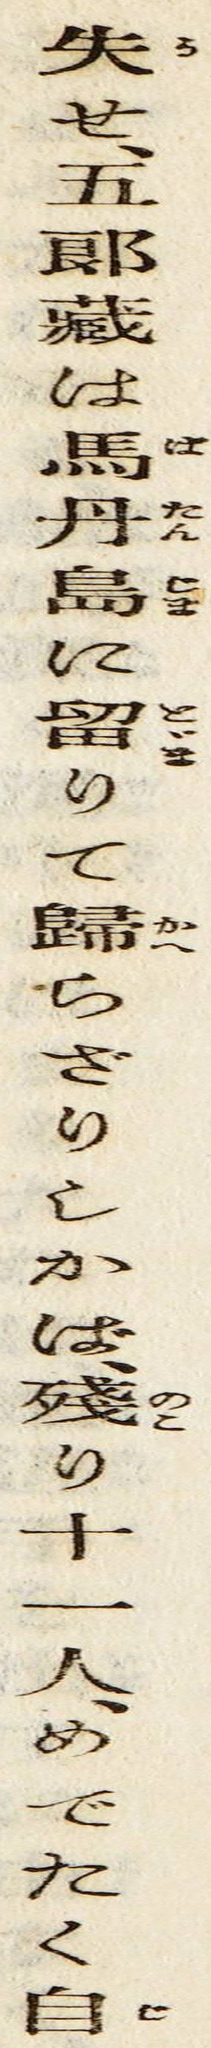失せ、五郎蔵は馬丹島に留りて帰らざりしかば、残り十一人、めでたく自
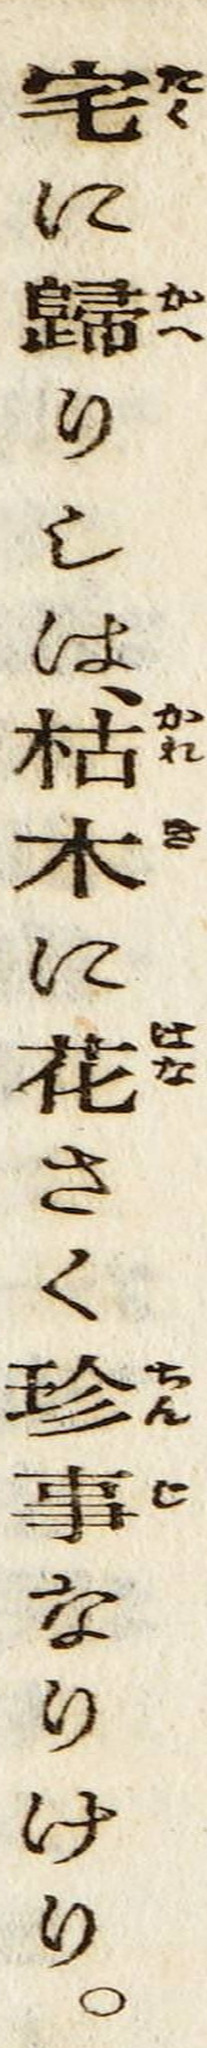宅に帰りしは、枯木に花さく珍事なりけり。

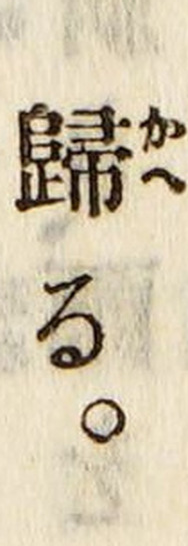帰る。
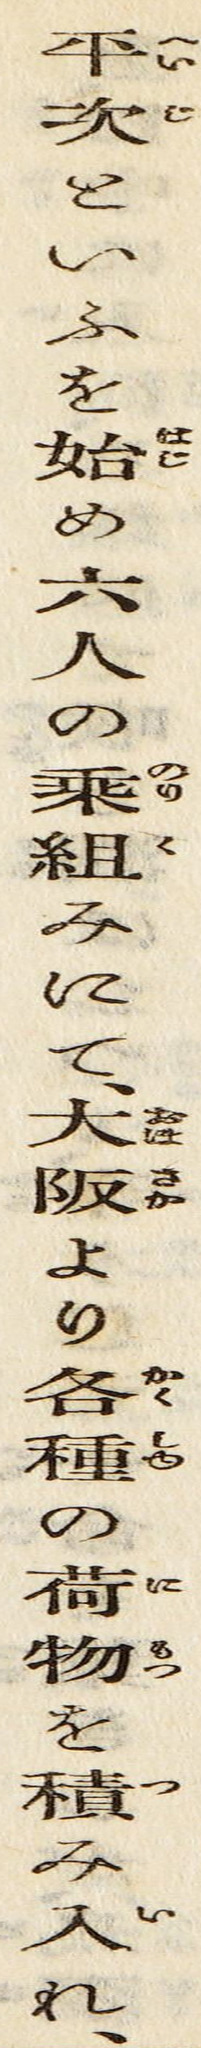平次といふを始め六人の乗組みにて、大阪より各種の荷物を積み入れ、
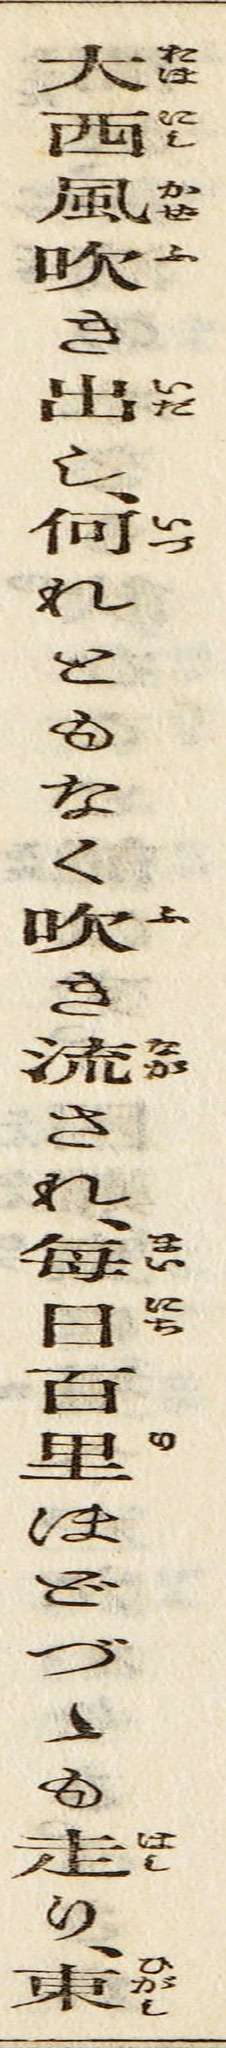大西風吹き出し、何れともなく吹き流され、毎日百里ほどづゝも走り、東
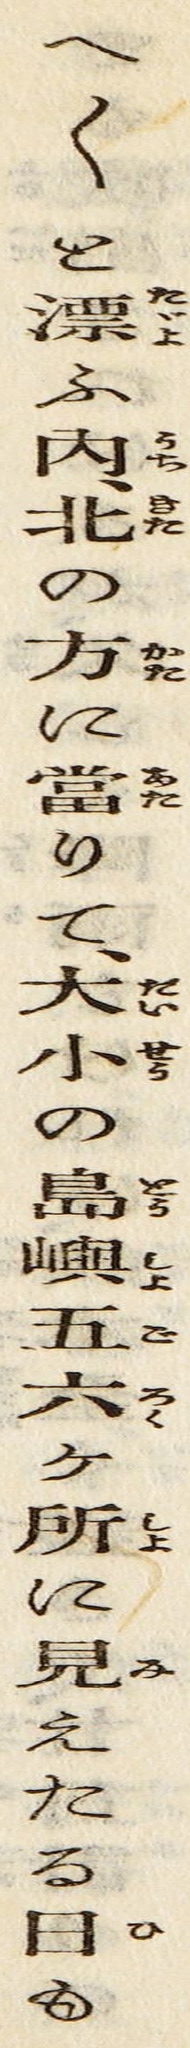へ〳〵と漂ふ内、北の方に当りて、大小の島嶼五六ケ所に見えたる日も
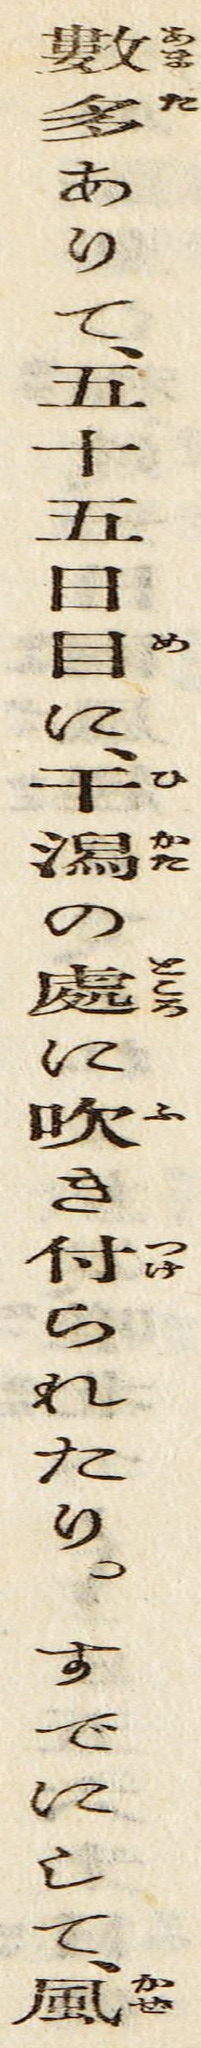数多ありて、五十五日目に、干潟の処に吹き付られたり。すでにして、風
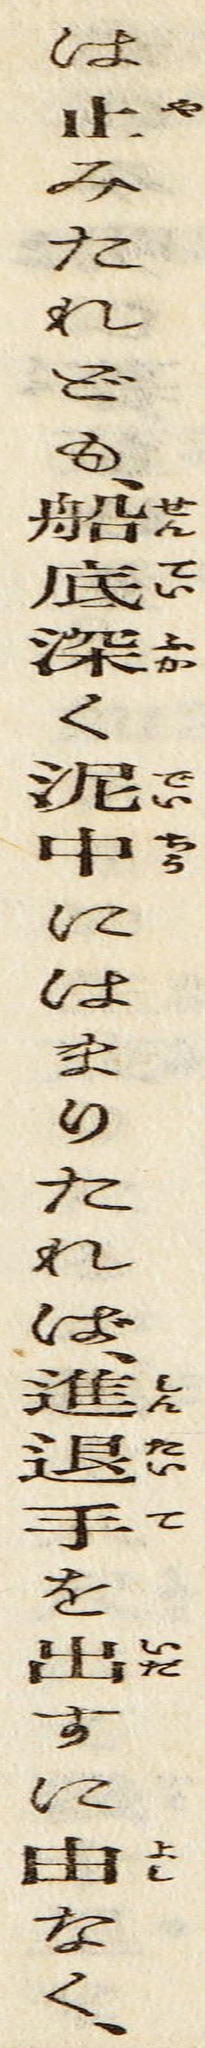は止みたれども、船底深く泥中にはまりたれば、進退手を出すに由なく、
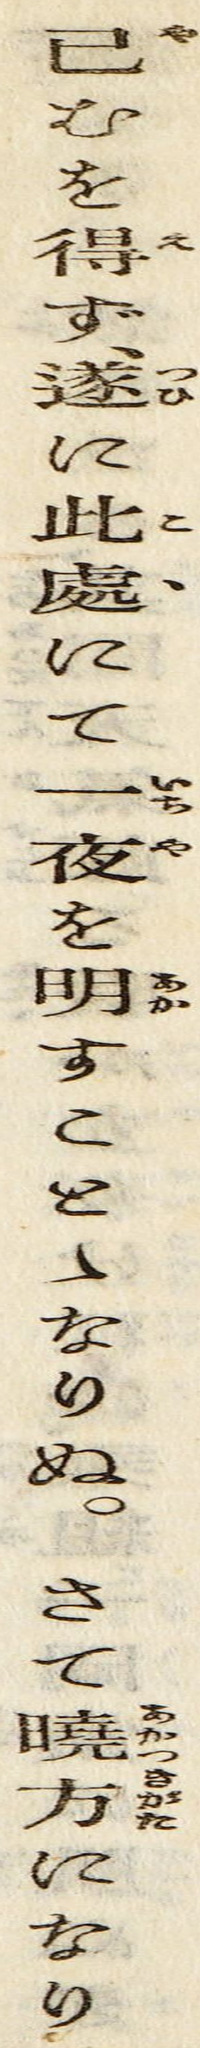已むを得ず、遂に此処にて一夜を明すことゝなりぬ。さて暁方になり
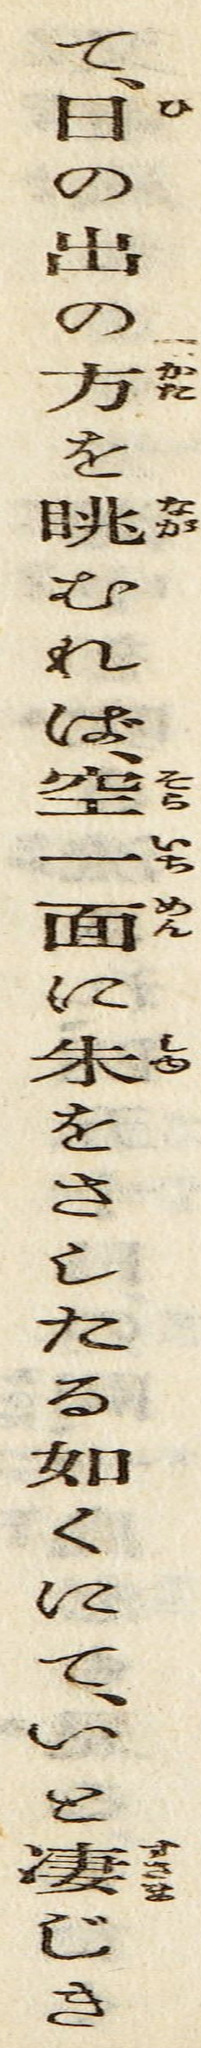て、日の出の方を眺むれば、空一面に朱をさしたる如くにて、いと凄じき

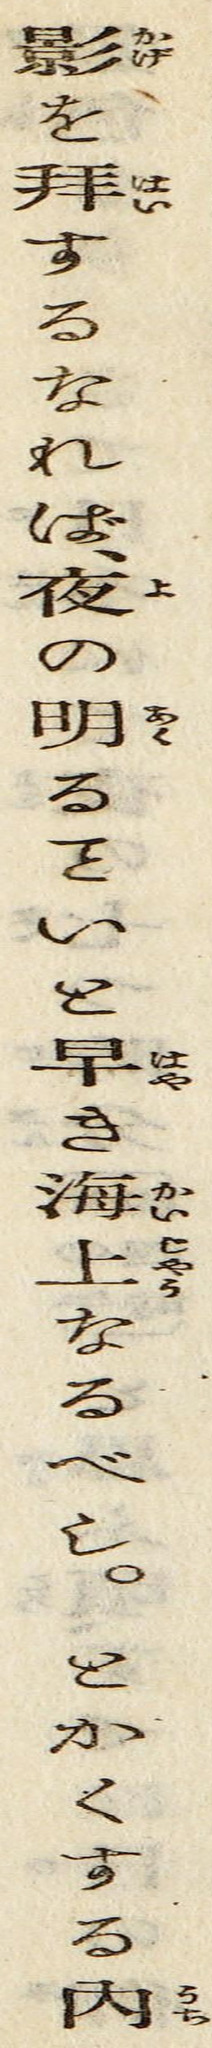影を拝するなれば、夜の明ることいと早き海上なるべし。とかくする内
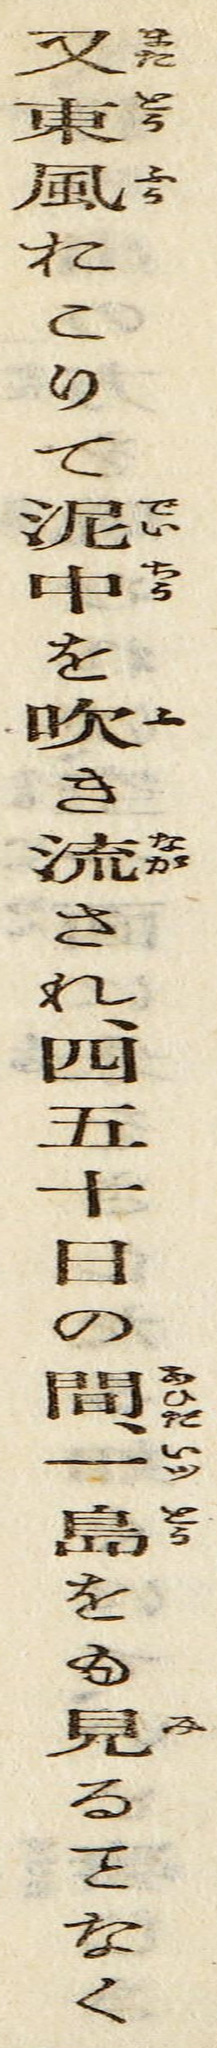又東風おこりて泥中を吹き流され、四五十日の間、一島をも見ることなく
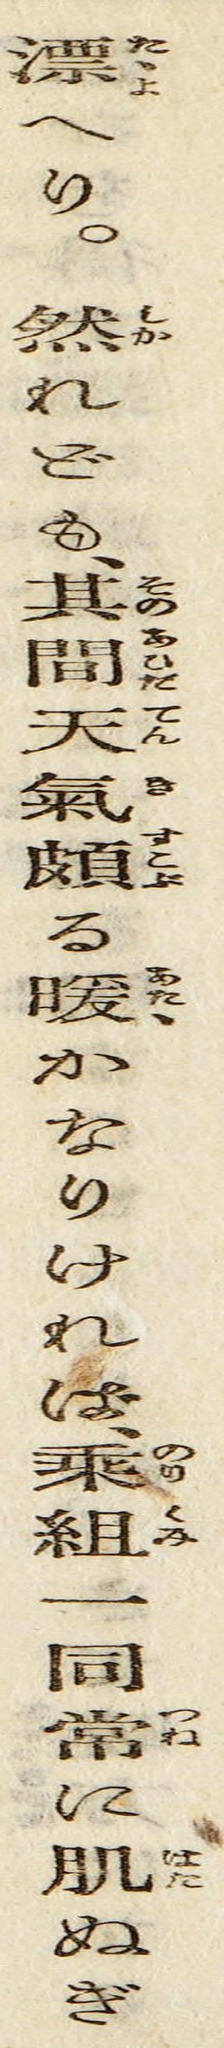漂へり。然れども、其間天気頗る暖なりければ、乗組一同常に肌ぬぎ
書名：日本漂流譚
